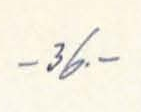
36.
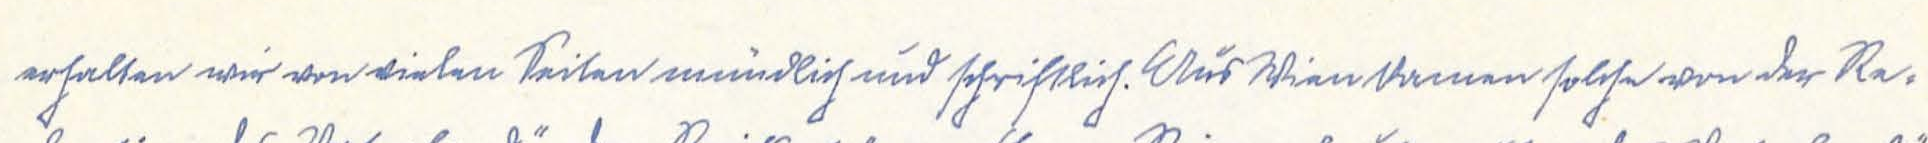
erhalten wir von vielen Seite mündlich und schriftlich. Aus Wien kamen solche von der Re-
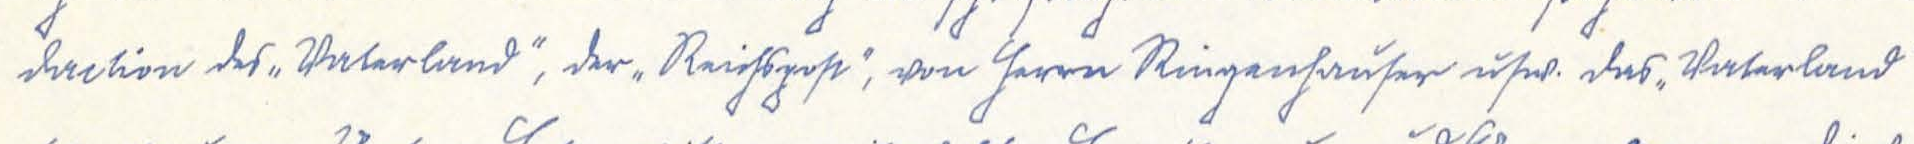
daction des „Vaterland“, der „Reichspost", von Herrn Ringenhauser usw. Das „Vaterland"
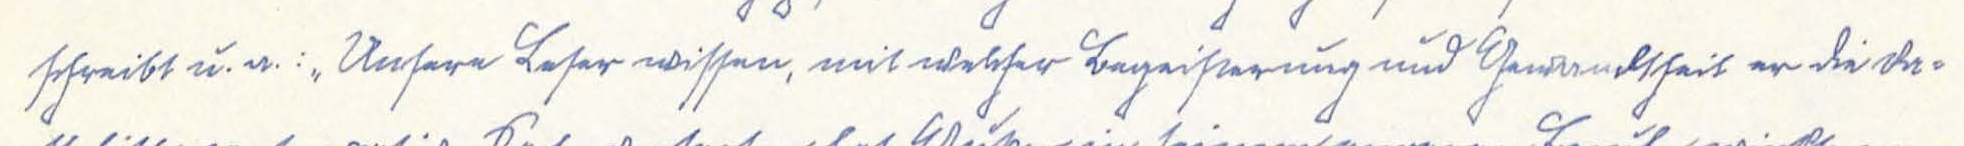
schreibt u. a.: „Unsere Lesern wissen, mit welcher Begeisterung und Gewandtheit er die ka-
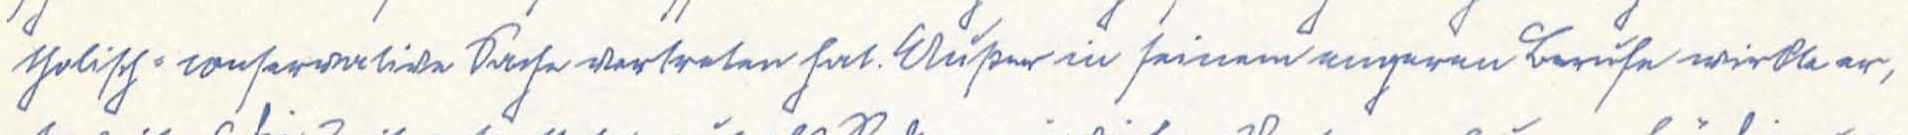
tholisch-conservative Sache vertreten hat. Außer in seinem anderen Beruf wirkte er,
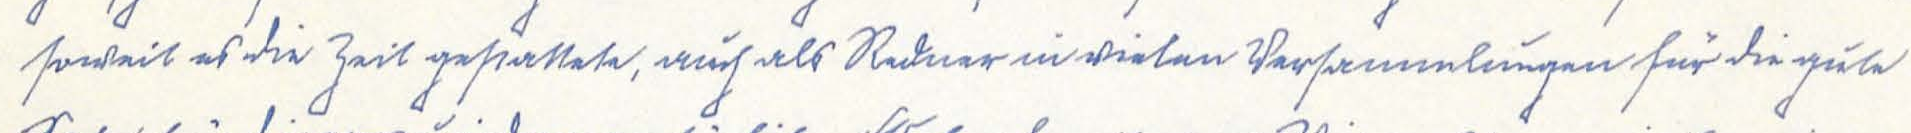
soweit es die Zeit gestattet, auch als Redner in vielen Versammlungen für die gute
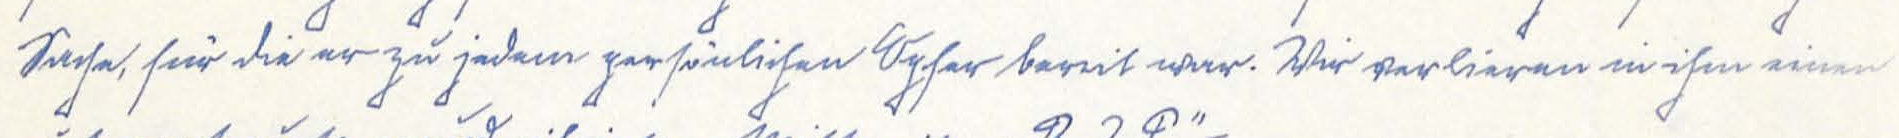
Sache, für die er zu jedem persönlichen Opfer bereit war. Wir verlieren in ihm einen
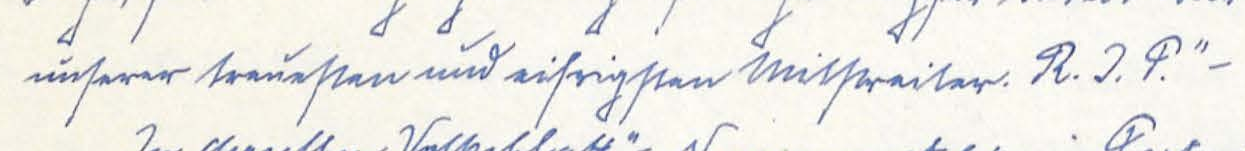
unserer treuesten und eifrigsten Mitstreiter. R.I.P."-
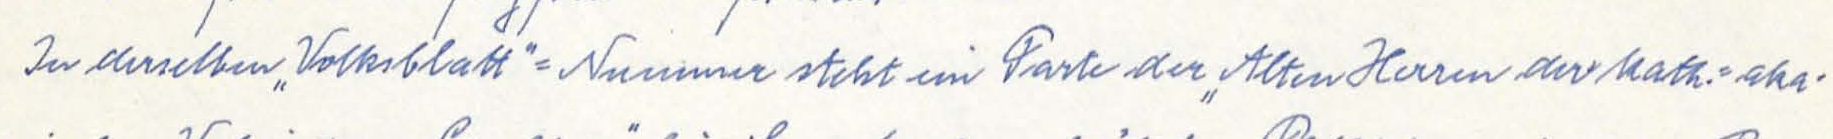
In derselben "Volksblatt" - Nummer steht ein Parte der "Alten Herren der kath.- aka-
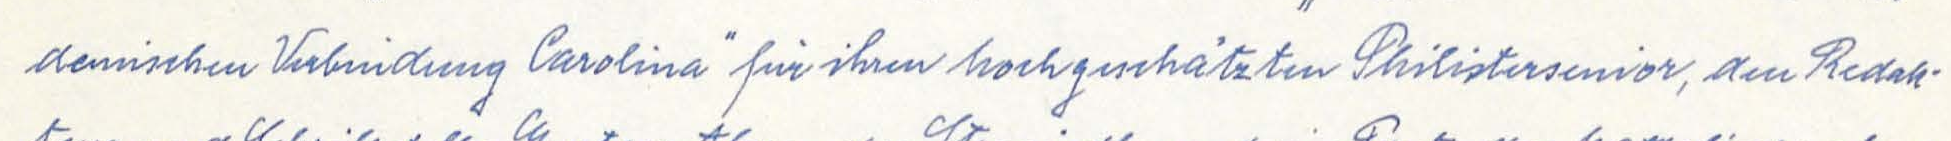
demischen Verbindung Carolina" für ihren hochgeschätzten Philistersenior, den Reda-
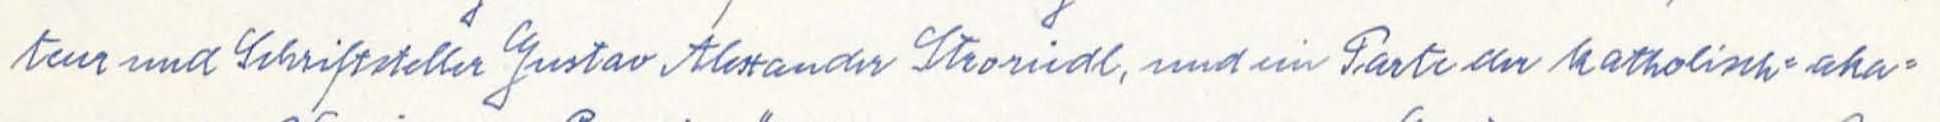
teur und Schriftsteller Gustav Alexander Stroriedl, und ein Parte der katholisch-aka-
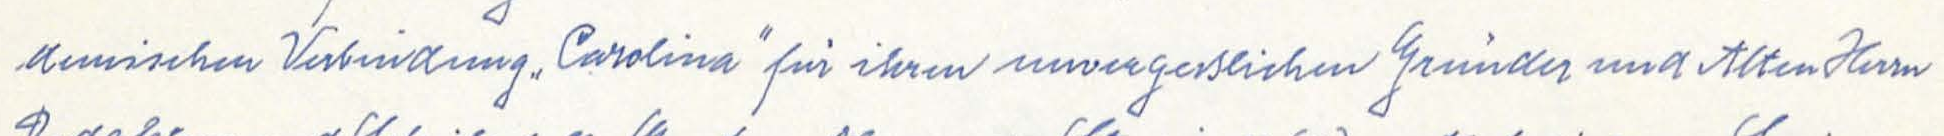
demischen Verbindung „Carolina“ für ihren unvergeßlichen Gründer und Alten Herrn
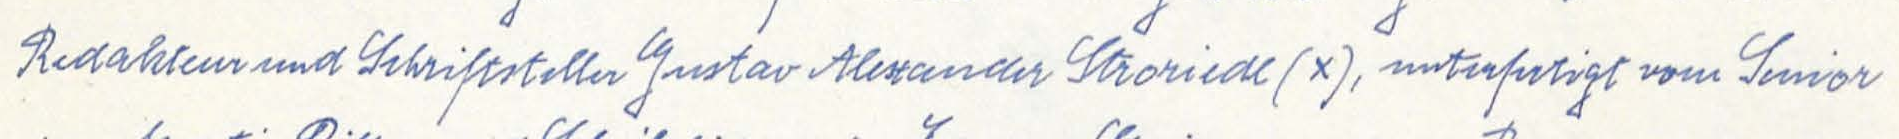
Redakteur und Schriftsteller Gustav Alexander Stroriedl (x) unterfertigt von Senior
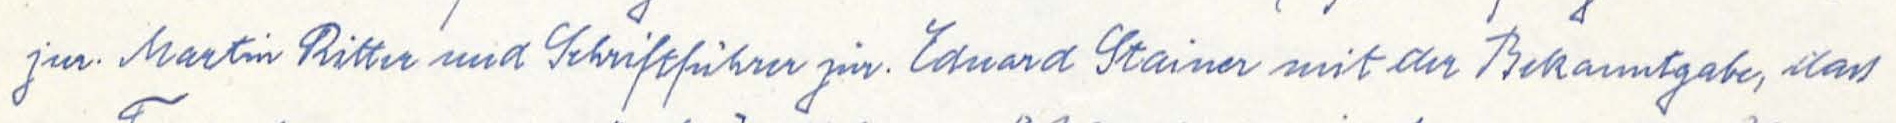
jur. Martin Ritter und Schriftführer jur. Eduard Stainer mit der Bekanntgabe, dass
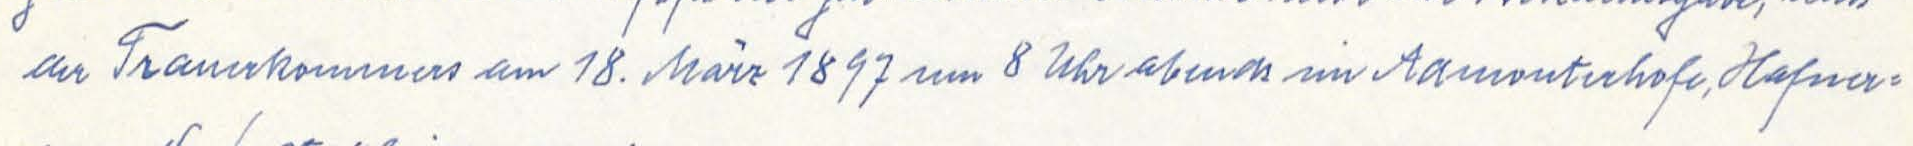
der Trauerkommers am 18. März 1897 um 8 Uhr abends im Admonterhofe, Hafner-
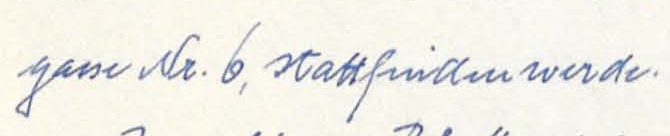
gasse Nr. 6 stattfinden werde.
